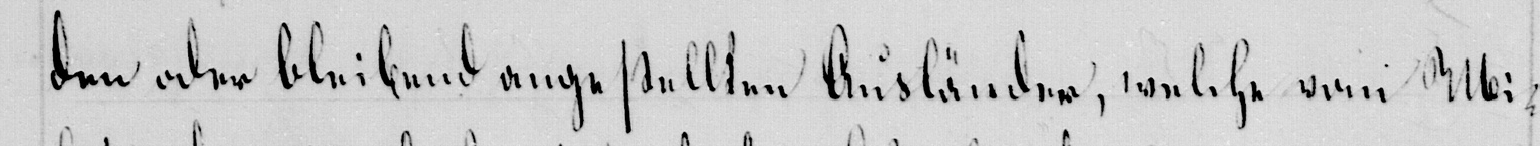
den oder bleibend angestellten Ausländer, welche vom Mi¬
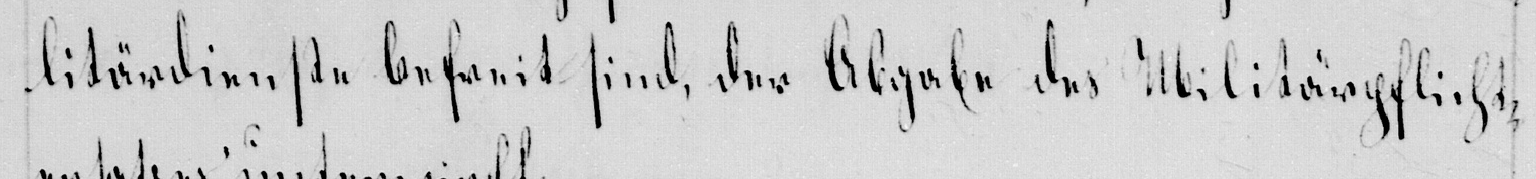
litärdienste befreit sind, der Abgabe des Militärpflicht¬
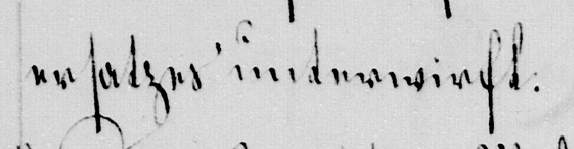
ersatzes unterwirft.
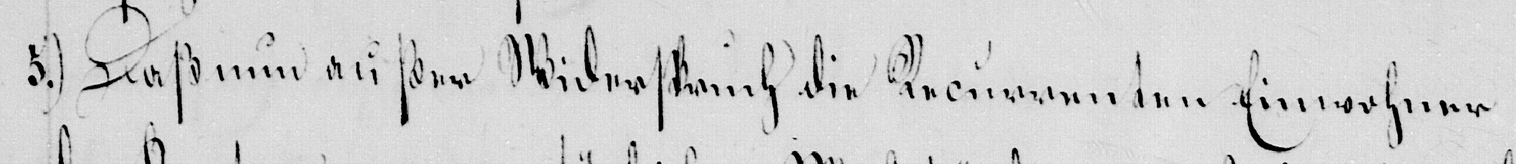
5.) Daß nun außer Widerspruch die Recurrenten Einnahmen
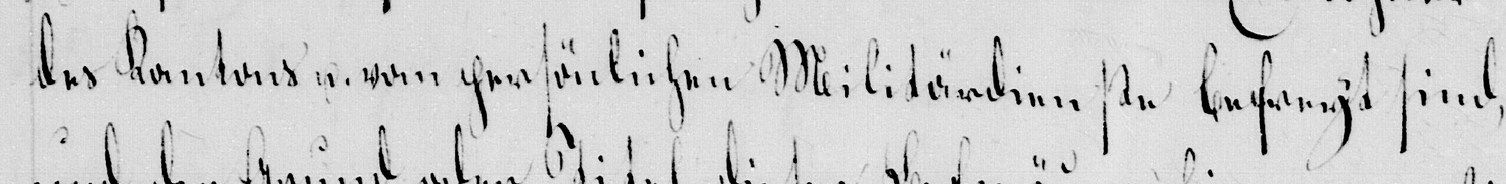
des Kantons u. vom persönlichen Militärdienste befreyt sind,
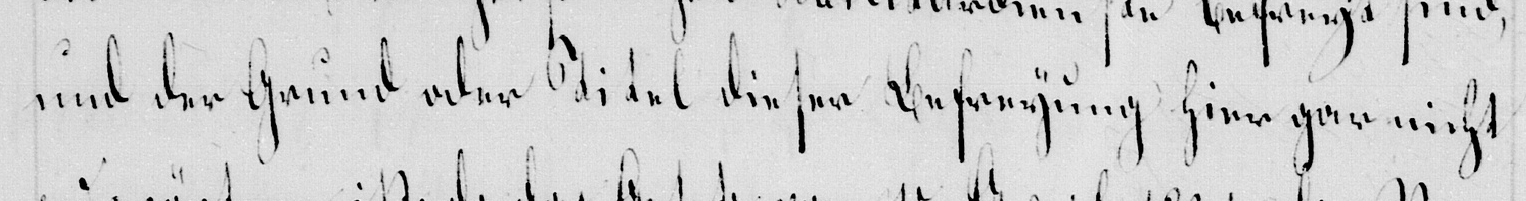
und der Grund oder Titel dieser Befreyung hier gar nicht
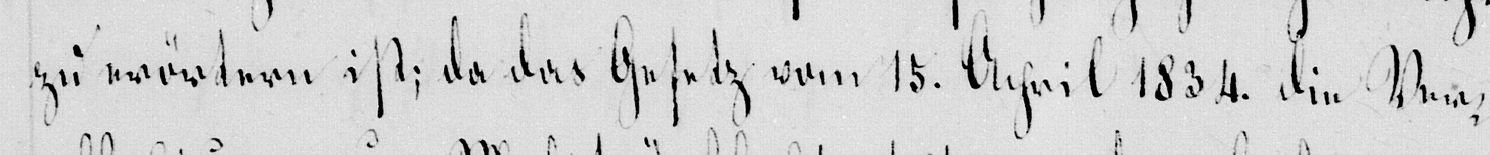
zu erörtern ist; da das Gesetz vom 15. April 1834. die Ver¬
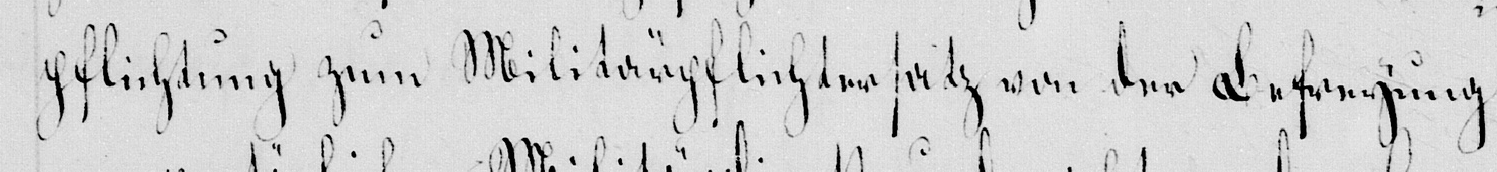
pflichtung zum Militärpflichtersatz von der Befreyung
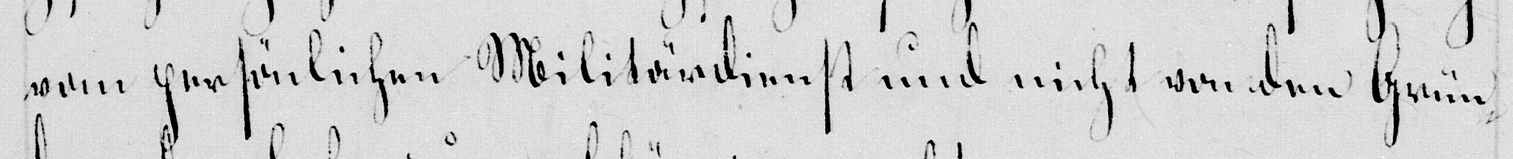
vom persönlichen Militärdienst und nicht von den Grün¬
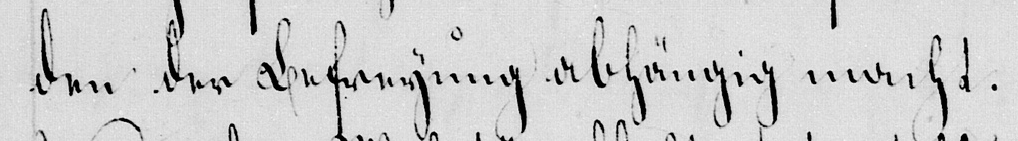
den der Befreyung abhängig macht.
